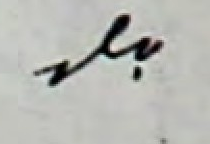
do
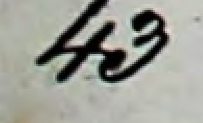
43
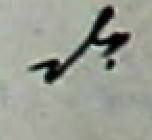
do
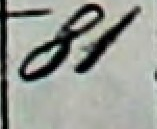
81
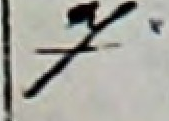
7
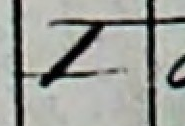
I
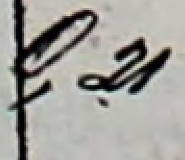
0,21
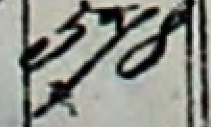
578
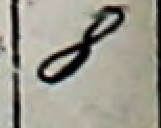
8
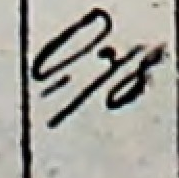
0,78
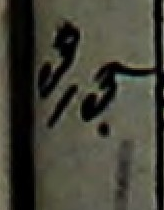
3,5
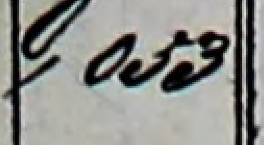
0,053
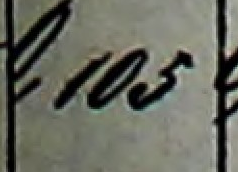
0,105
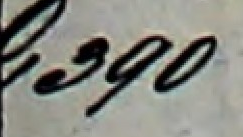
0,390
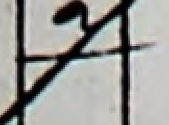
7
